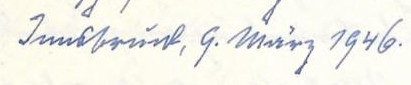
Innsbruck, 9. März 1946.
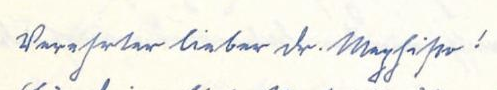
Verehrter lieber Dr. Mephisto!
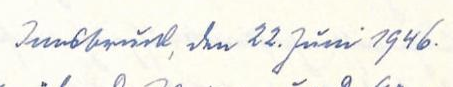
Innsbruck, den 22. Juni 1946.
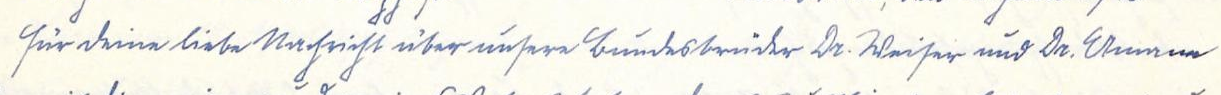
Für deine liebe Nachricht über unsere Bundesbrüder Dr. Weißer und Dr. Amann
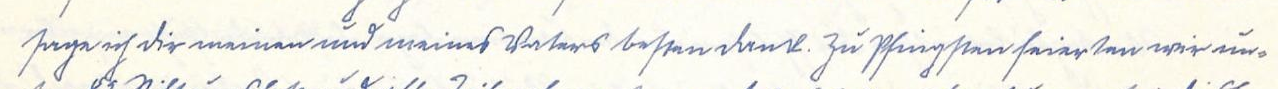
sage ich dir meinen und meines Vaters bestem Dank. Zu Pfingsten feierten wir un-
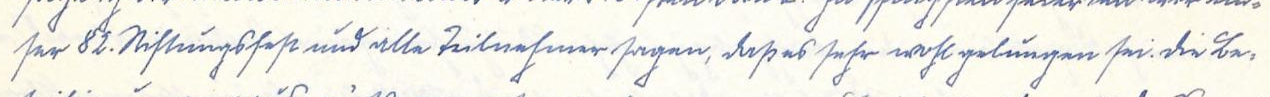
ser 82. Stiftungsfest und alle Teilnehmer sagen, daß es sehr wohl gelungen sei. Die Be-
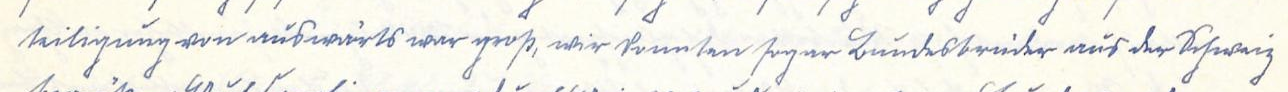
teiligung von auswärts war groß, wir konnten sogar Bundesbrüder aus der Schweiz
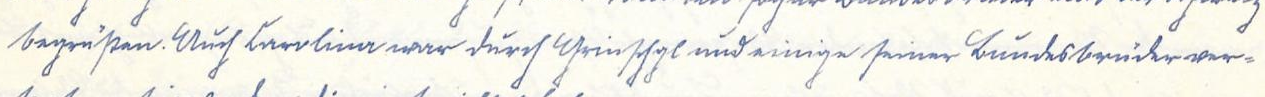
begrüßen. Auch Carolina war durch Grinschgl und einige seiner Bundesbrüder ver-
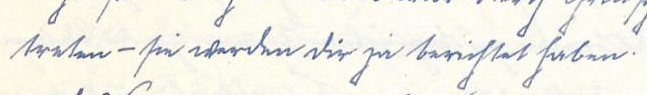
treten-sie werden dir ja berichtet haben.
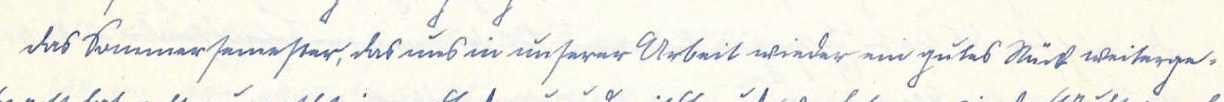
Das Sommersemester, das uns in unserer Arbeit wieder ein gutes Stück weiterge-
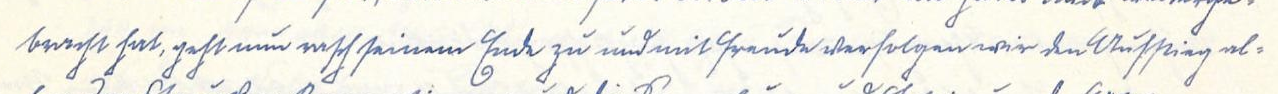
bracht hat, geht nun rasch seinem Ende zu und mit Freude verfolgen wir den Aufstieg al-
